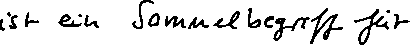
ist ein Sammelbegriff für
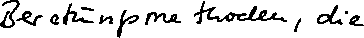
Beratungsmethoden, die
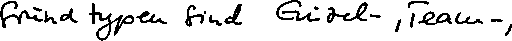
Grundtypen sind Einzel-, Team-,
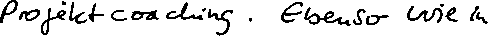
Projektcoaching. Ebenso wie in
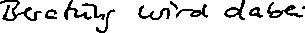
Beratung wird dabei
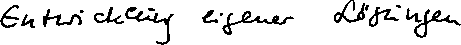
Entwicklung eigener Lösungen
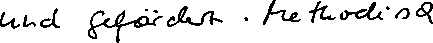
und gefördert. Methodisch
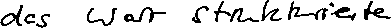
das Wort strukturierte
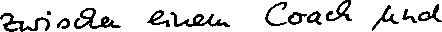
zwischen einem Coach und
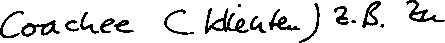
Coachee (Klienten) z. B. zu
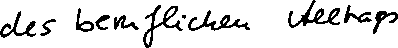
des beruflichen Alltags
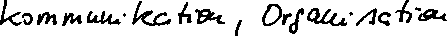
Kommunikation, Organisation
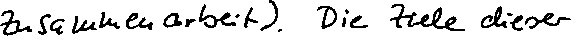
Zusammenarbeit). Die Ziele dieser
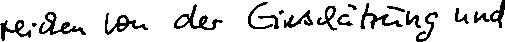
reichen von der Einschätzung und
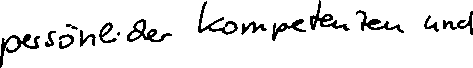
persönlicher Kompetenzen und
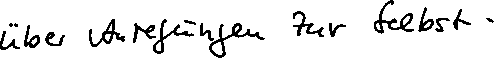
über Anregungen zur Selbst-
